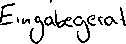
Eingabegerät
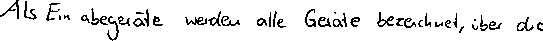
Als Eingabegeräte werden alle Geräte bezeichnet, über die
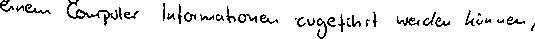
einem Computer Informationen zugeführt werden können,
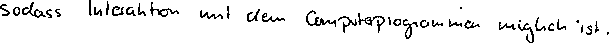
sodass Interaktion mit den Computerprogrammen möglich ist.
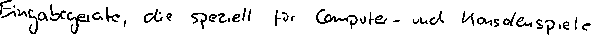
Eingabegeräte, die speziell für Computer- oder Konsolenspiele
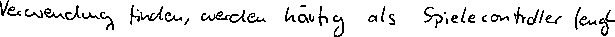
Verwendung finden, werden häufig als Spielecontroller (engl
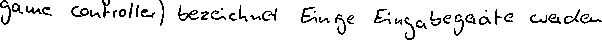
game controller) bezeichnet. Einige Eingabegeräte werden
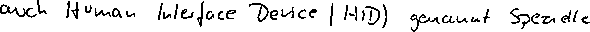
auch Human Interface Device (HID) genannt. Spezielle
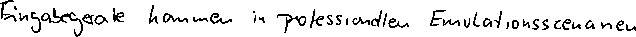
Eingabegeräte kommen in professionellen Emulationsszenarien
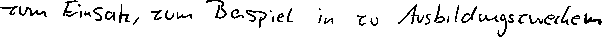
zum Einsatz, zum Beispiel in zu Ausbildungszwecken
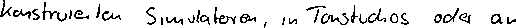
konstruierten Simulatoren, in Tonstudios oder an
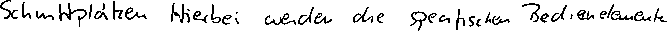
Schnittplätzen. Hierbei werden die spezifischen Bedienelemente
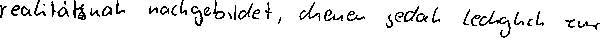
realitätsnah nachgebildet, dienen jedoch lediglich zur
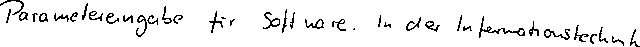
Parametereingabe für eine Software. In der Informationstechnik
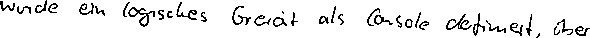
wurde ein logisches Gerät Console definiert, über
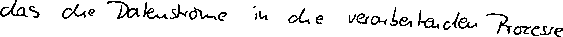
das die Datenströme in die verarbeitenden Prozesse
